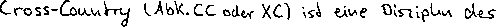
Cross-Country (Abk. CC oder XC) ist eine Disziplin des
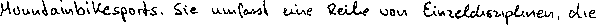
Mountainbikesports. Sie umfasst eine Reihe von Einzeldisziplinen, die
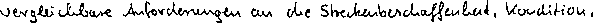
ergleichbare Anforderungen an die Streckenbeschaffenheit, Kondition,
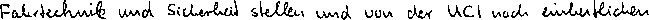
Fahrtechnik und Sicherheit stellen und von der UCI nach einheitlichen
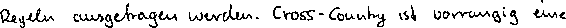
Regeln ausgetragen werden. Cross-Country ist vorrangig eine
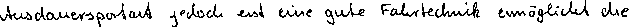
Ausdauersportart, jedoch erst eine gute Fahrtechnik ermöglicht die
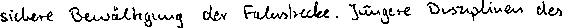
sichere Bewältigung der Fahrstrecke. Jüngere Disziplinen des
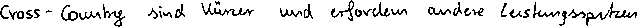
Cross-Country sind kürzer und erfordern andere Leistungsspitzen
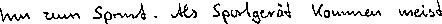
hin zum Sprint. Als Sportgerät kommen meist
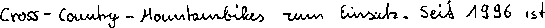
Cross-Country-Mountainbikes zum Einsatz. Seit 1996 ist
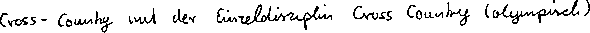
Cross-Country mit der Einzeldisziplin Cross Country (olympisch)
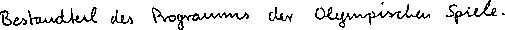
Bestandteil des Programms der Olympischen Spiele.
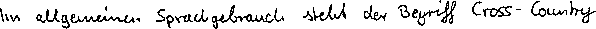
Im allgemeinen Sprachgebrauch steht der Begriff Cross-Country
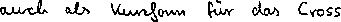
auch als Kurzform für das Cross
